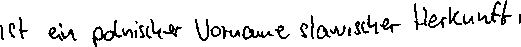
ist ein polnischer Vorname slawischer Herkunft,
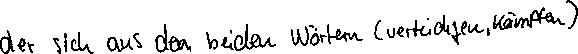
der sich aus den beiden Wörtern (verteidigen, kämpfen)
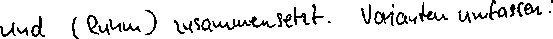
und (Ruhm) zusammensetzt. Varianten umfassen:
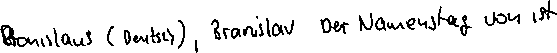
Bronislaus (Deutsch), Branislav. Der Namenstag von ist
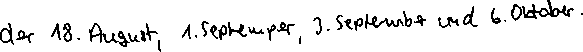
der 18. August, 1. September, 3. September und 6. Oktober.
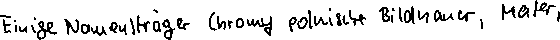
Einige Namensträger Chromy polnischer Bildhauer, Maler,
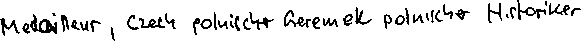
Medailleur, Czech polnischer Geremek polnischer Historiker
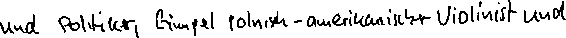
und Politiker, Gimpel polnisch-amerikanischer Violinist und
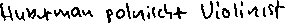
Huberman polnischer Violinist
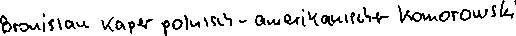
Bronislau Kaper polnisch-amerikanischer Komorowski
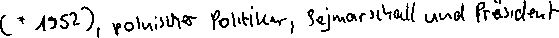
(* 1952), polnischer Politiker, Sejmmarschall und Präsident
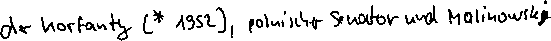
der Korfanty (* 1952), polnischer Senator und Malinowski
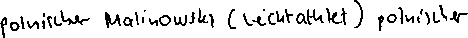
polnischer Malinowski (Leichtathlet) polnischer
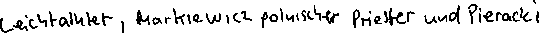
Leichtathlet, Markiewicz polnischer Priester und Pieracki
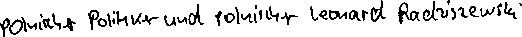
polnischer Politiker und polnischer Leonard Radziszewski
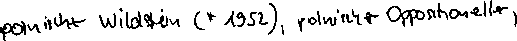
polnischer Wildstein (* 1952), polnischer Oppositioneller,
